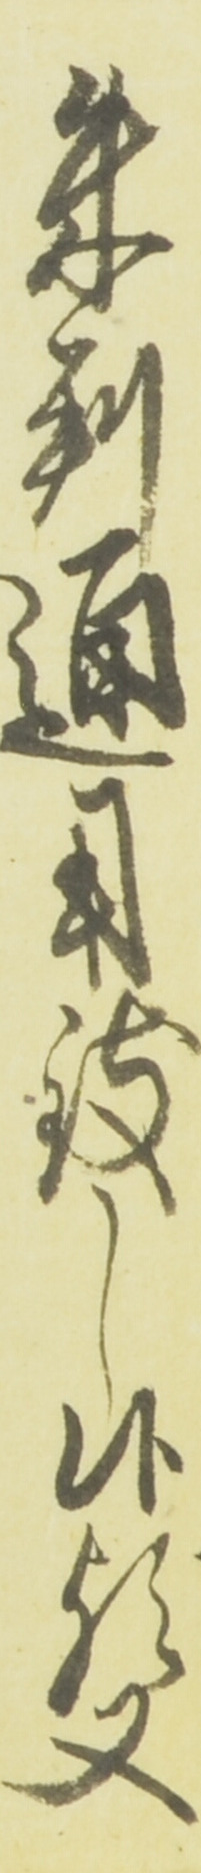朱判通用致し候猶又
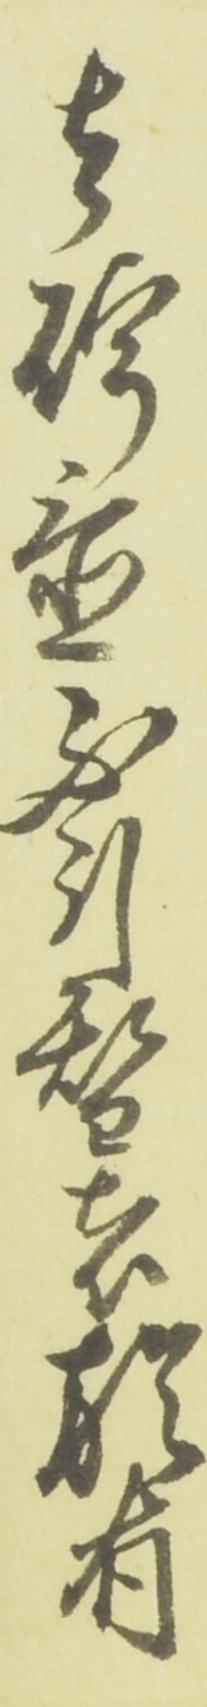は貯置不引替は猶有之
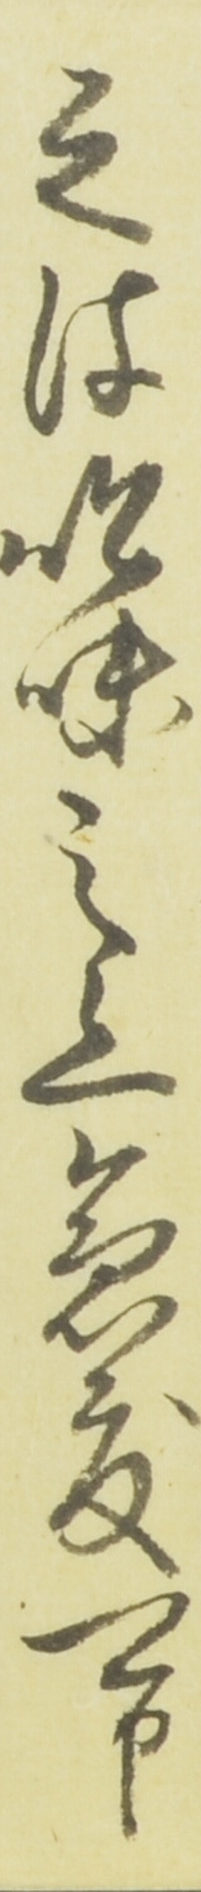之は吟味之上急度可申
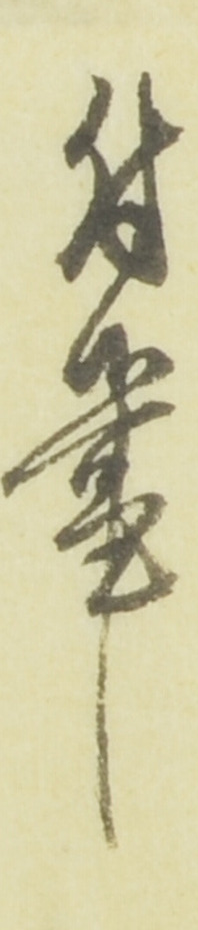付候事
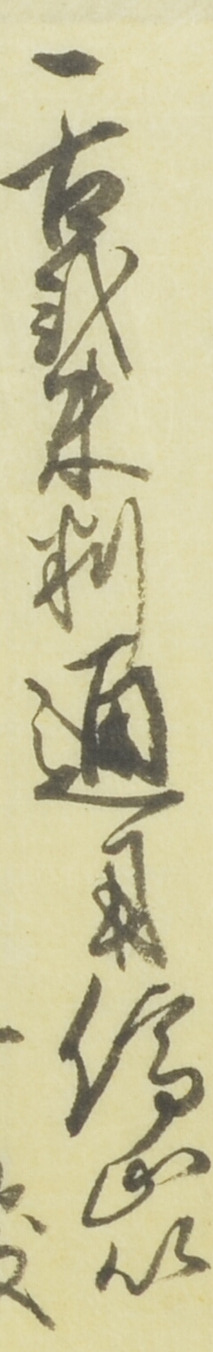一古弐朱判通用停止以
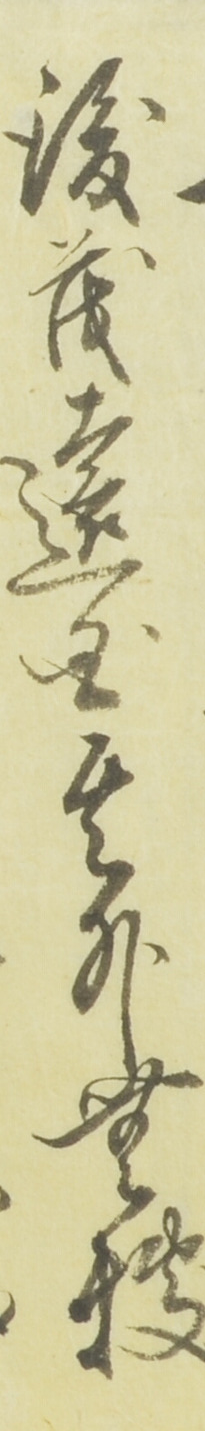後も遠国其外無拠
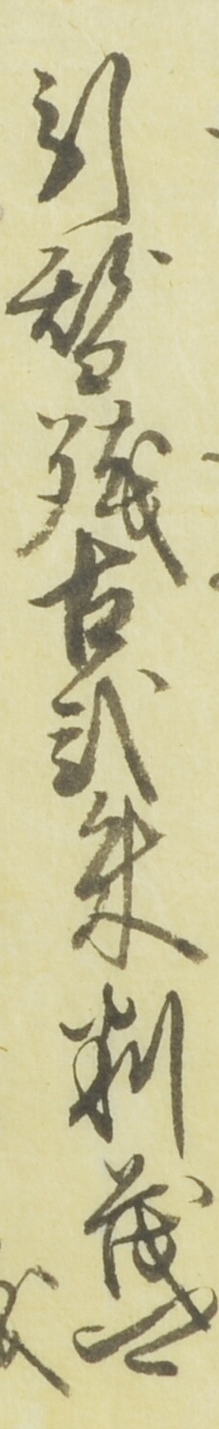引替残古弐朱判も可
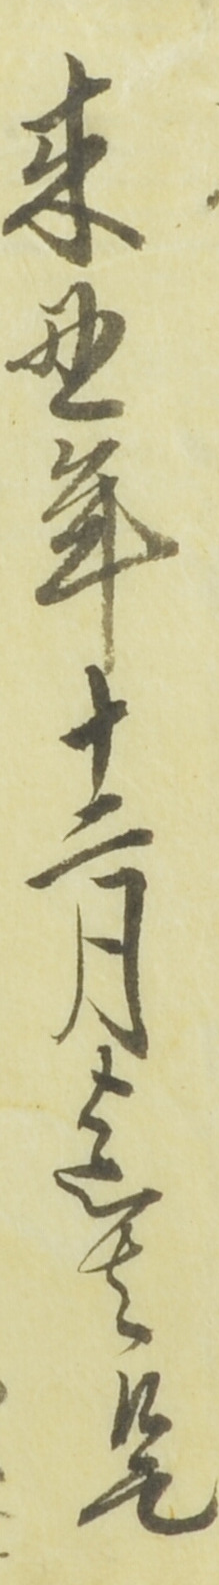来丑年十二月迄は是
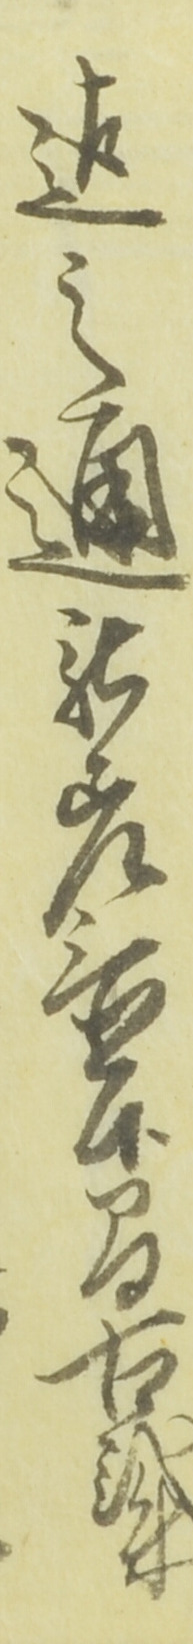迄之通被差置候間古弐朱
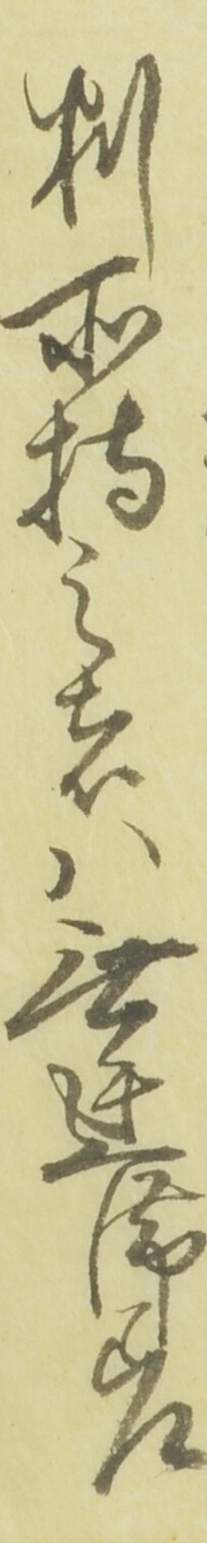判所持之者ハ無遅滞差
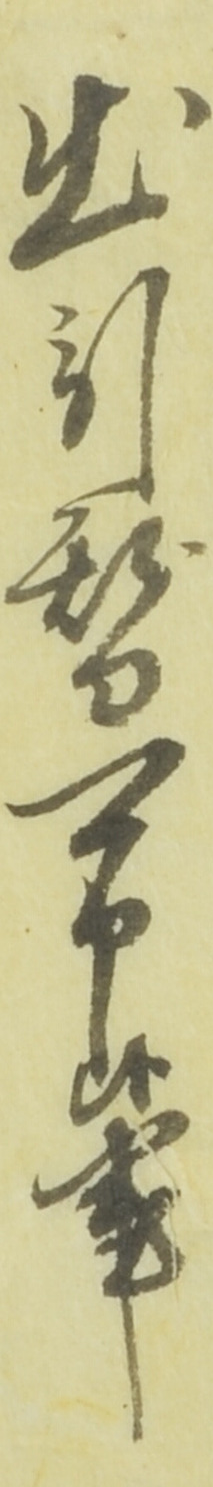出引替可申候事
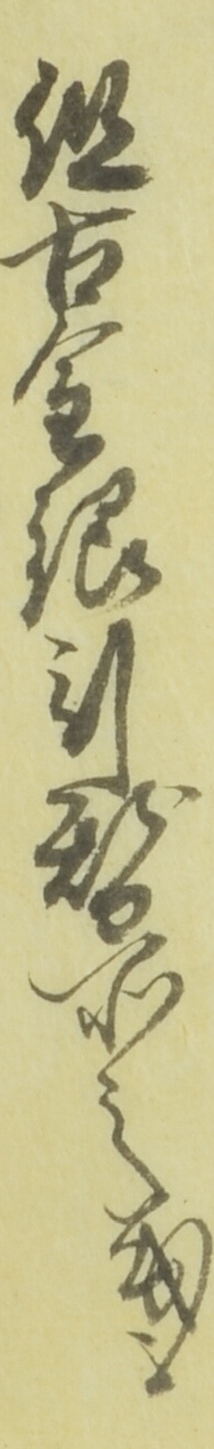但金銀引替所之義も
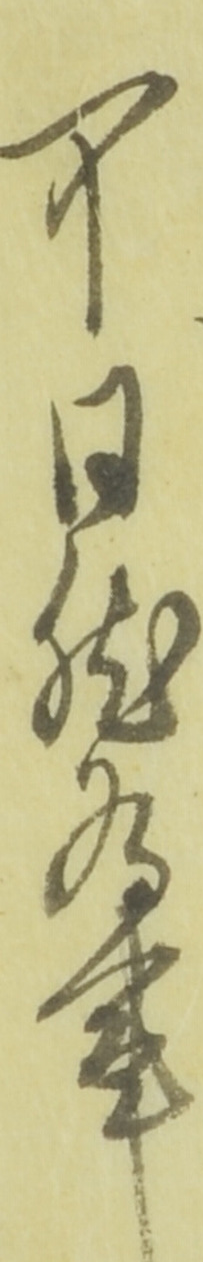可同然為事
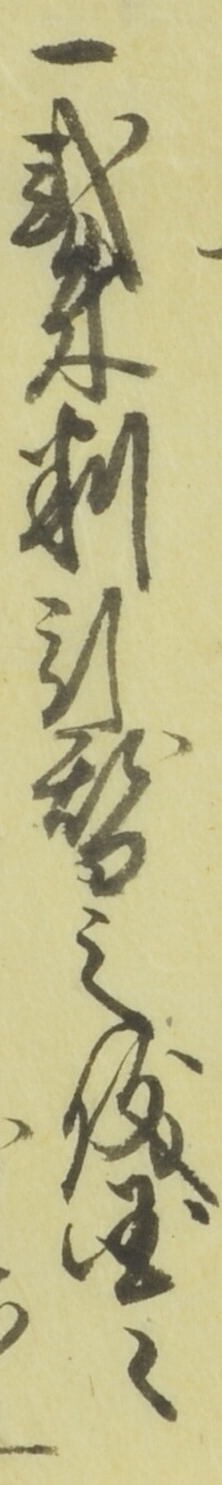一弐朱判引替之儀国々
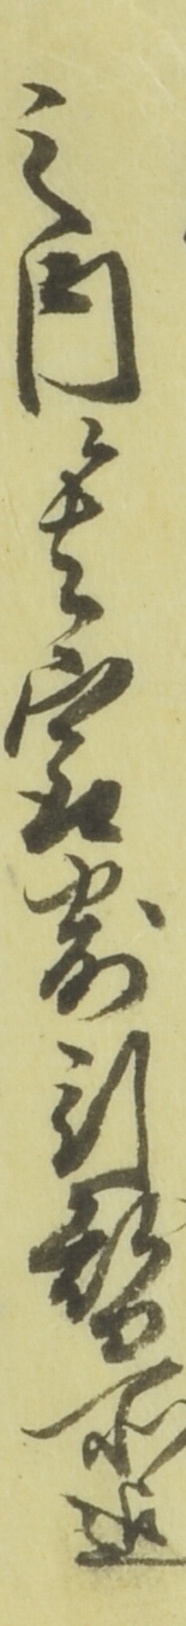之内ニは最寄引替所迄
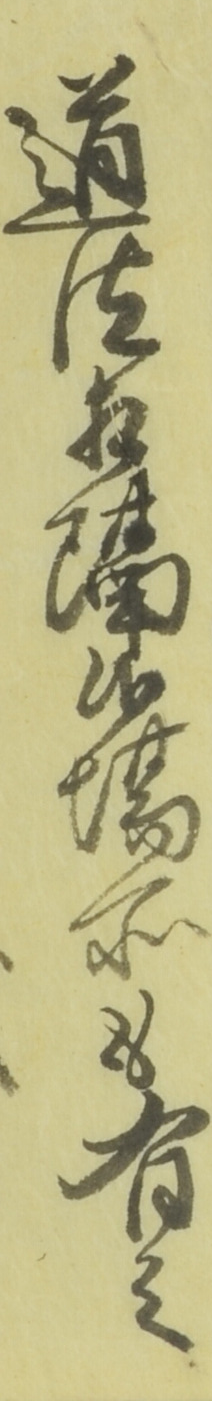道法相場候場所も有之
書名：御触書御書附控
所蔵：伊那市立高遠町図書館・合同会社AMANE
